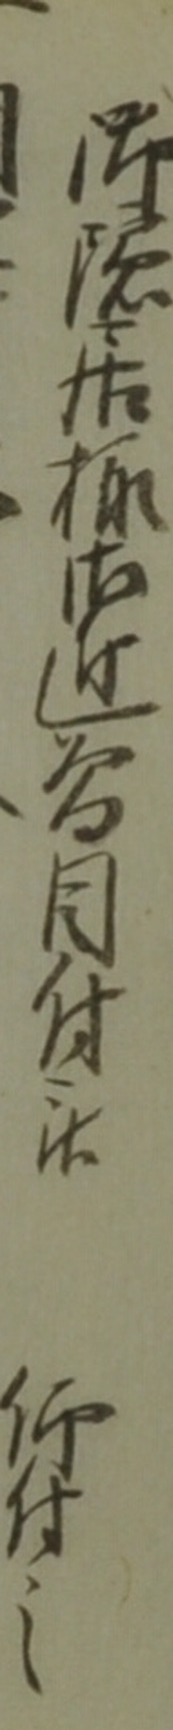御隠居様御近習目付被仰付之
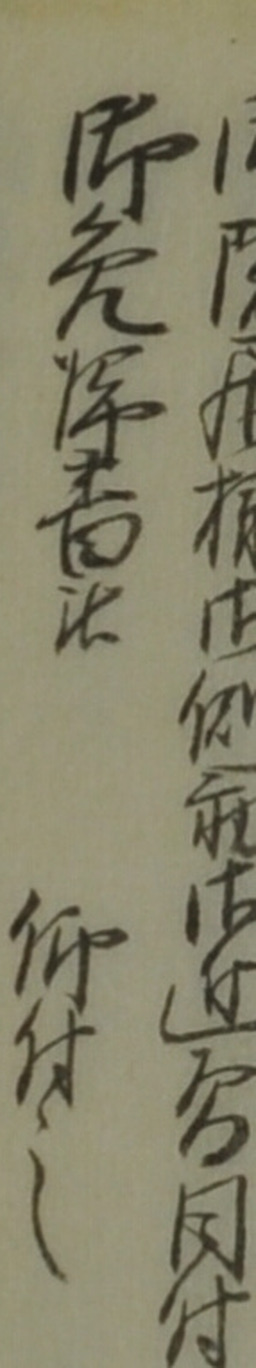御免帰番被仰付之
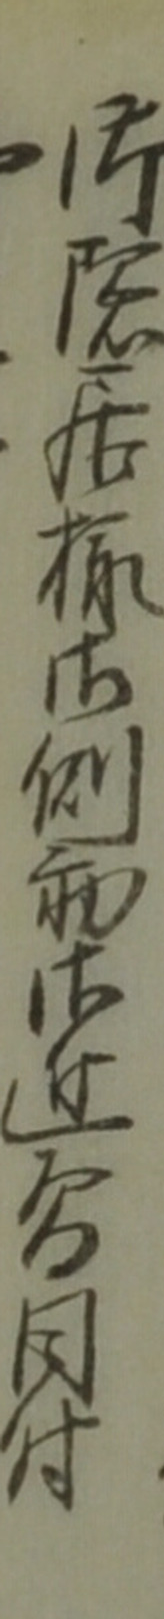御隠居様御側勤御近習目付
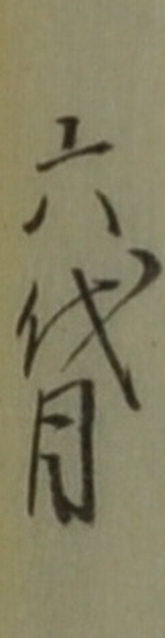六代目
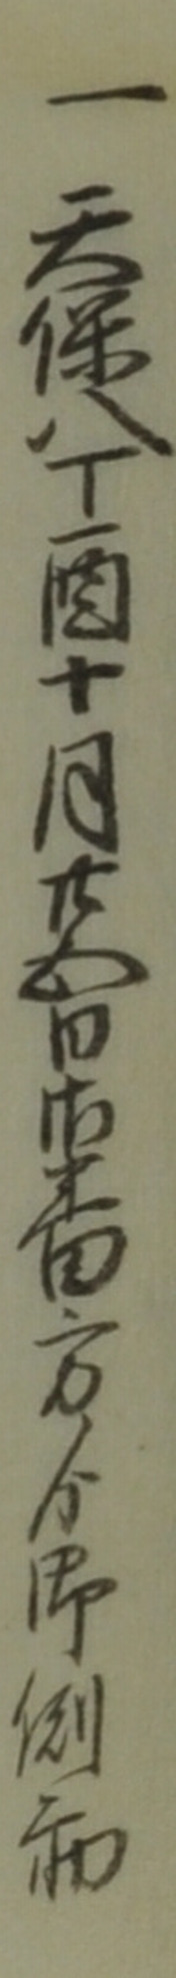一天保八丁酉十月廿五日御番方ゟ御側勤
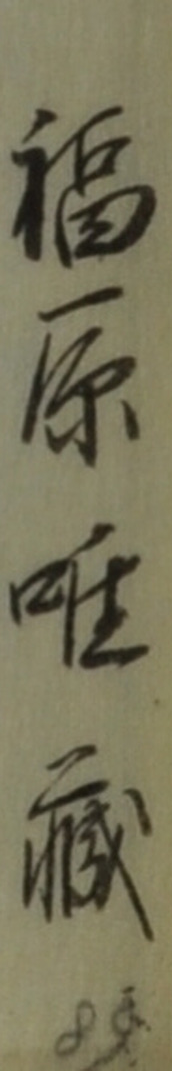福原唯蔵
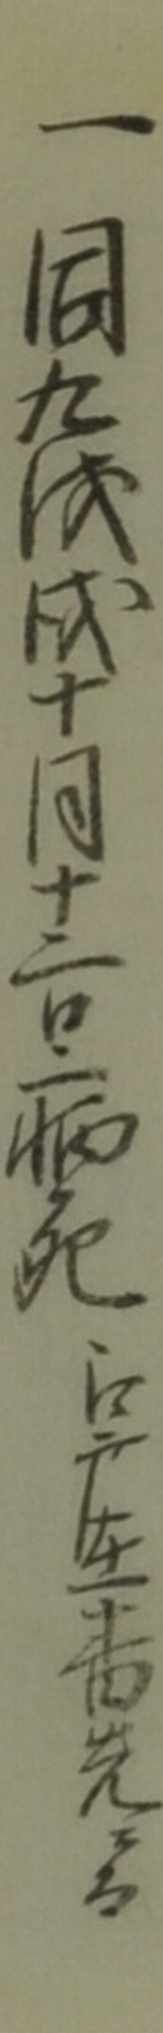一同九戊戌十月十二日病死江戸在番先ニ而
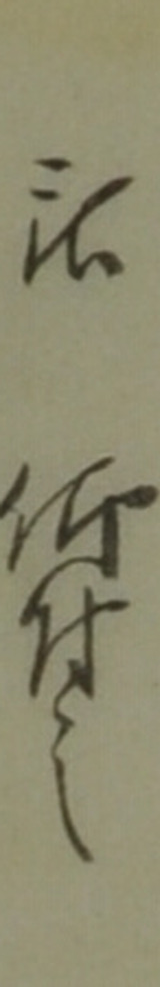被仰付之
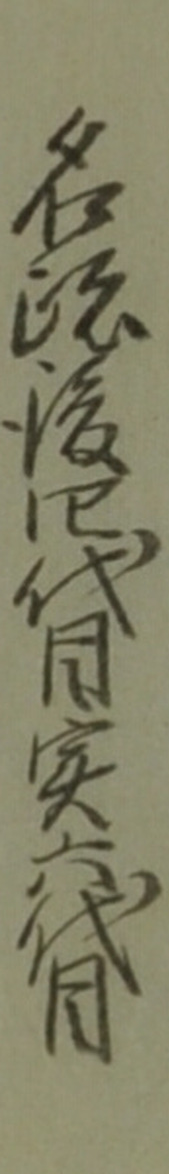名跡後四代目実六代目
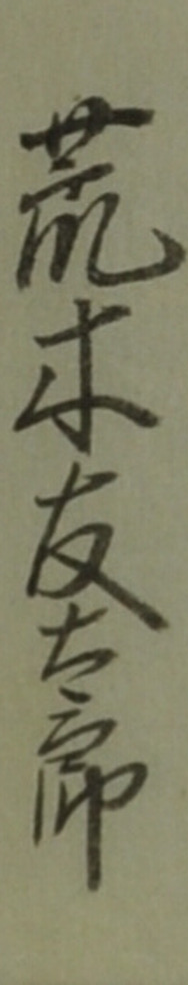荒木友太郎
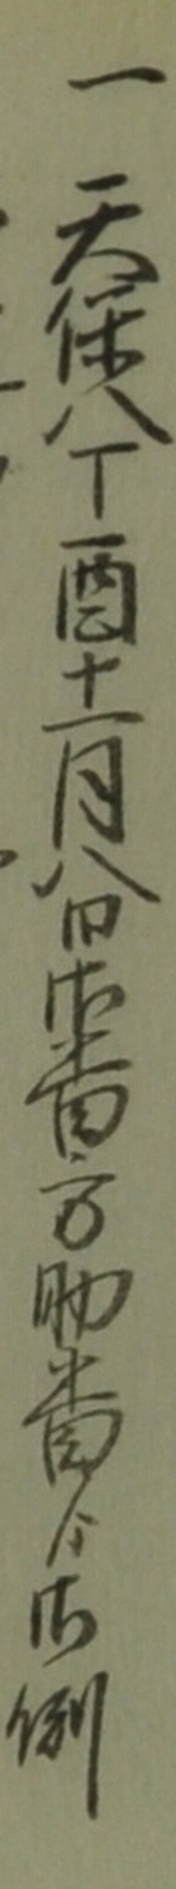一天保八丁酉十一月八日御番方助番ゟ御側
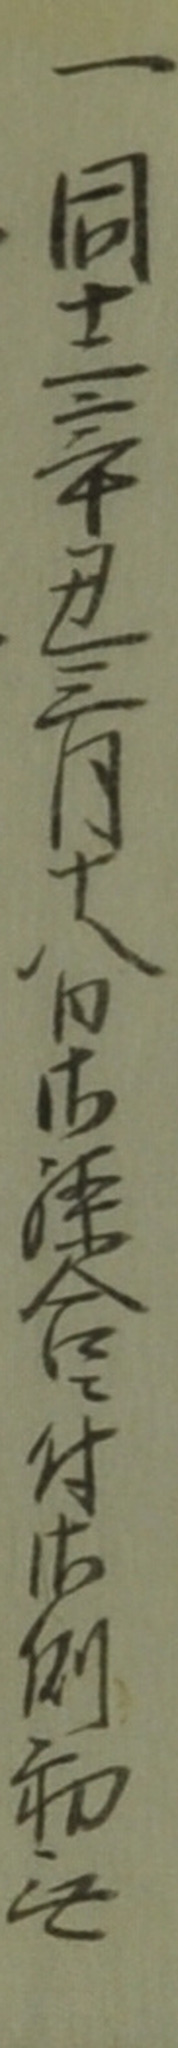一同十二辛丑三月十八日御繰合ニ付御側勤無
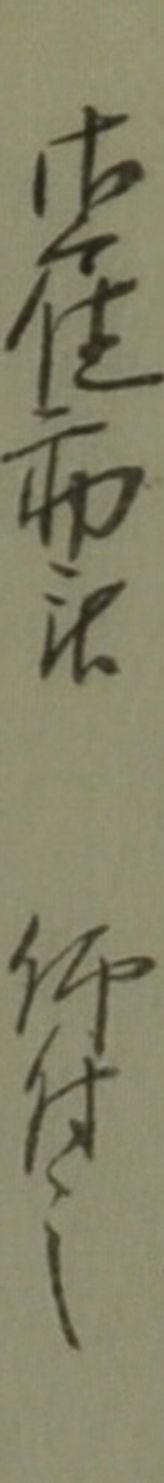御雇勤被仰付之
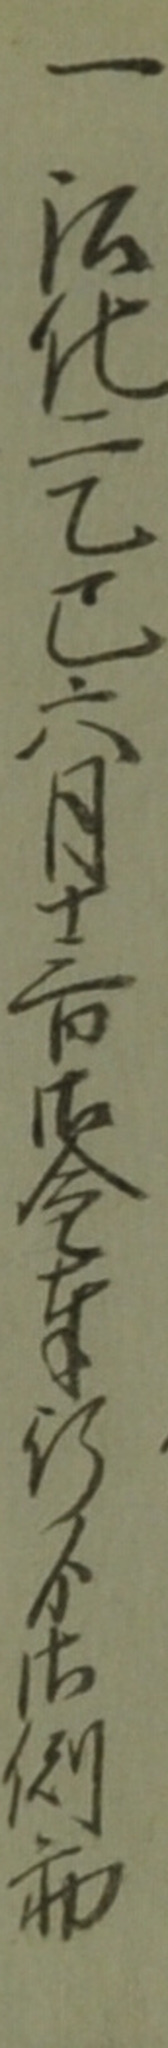一弘化二乙巳六月十三日御金奉行ゟ御側勤
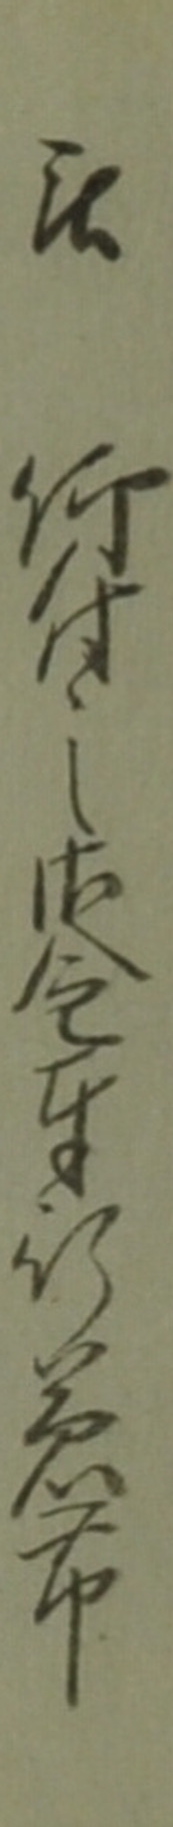被仰付之御金近習兼帯
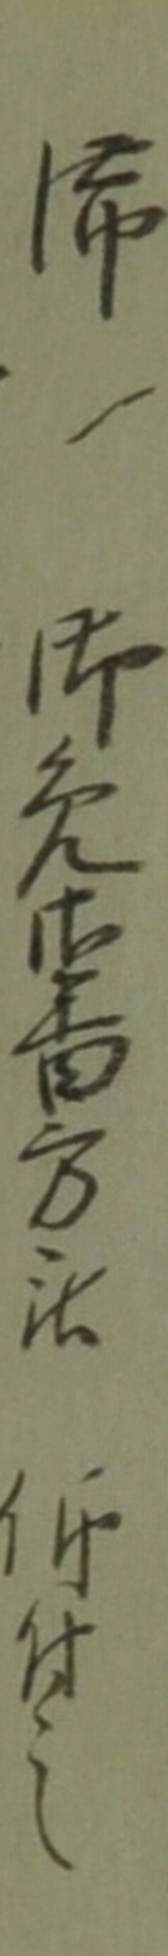滞御免御番方被仰付之
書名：諸御役代々録（五）
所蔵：伊那市立高遠町図書館・合同会社AMANE
